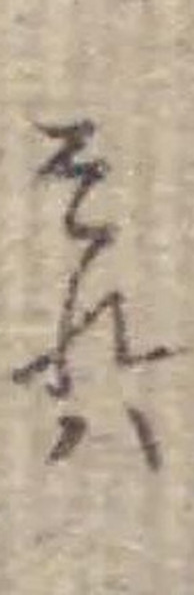それは
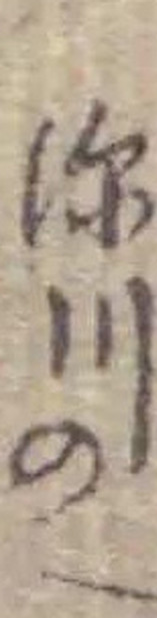深川の
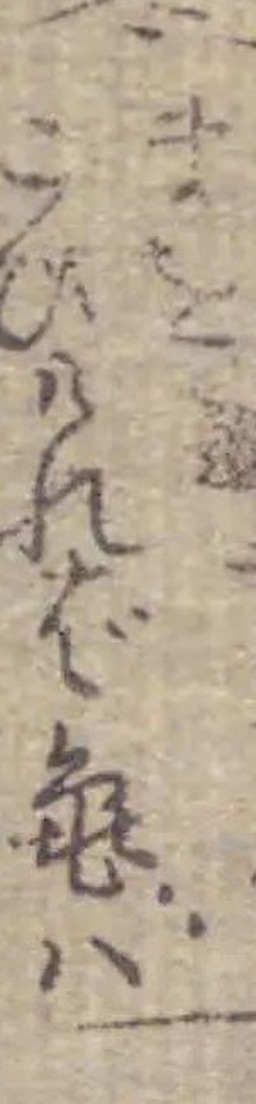こひければ亀は
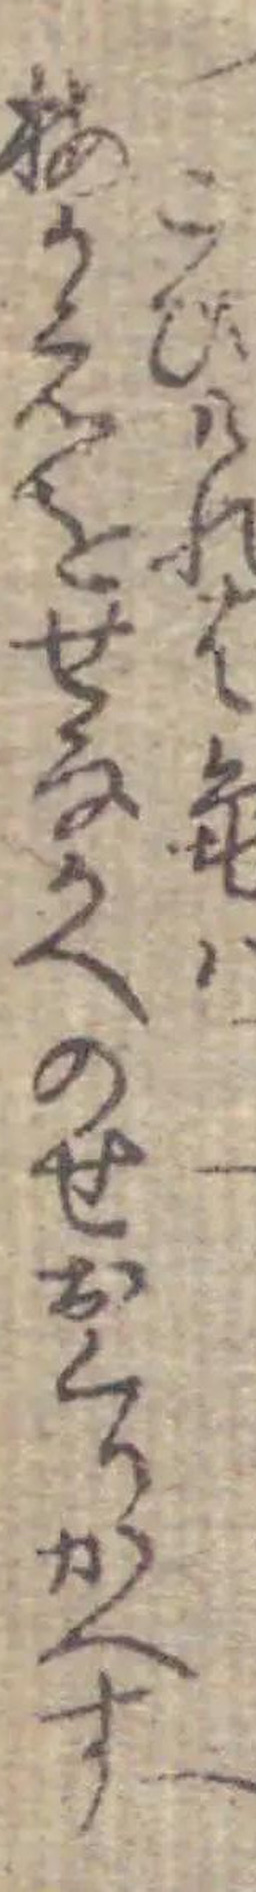梅かえをせなかへのせおくりかへす

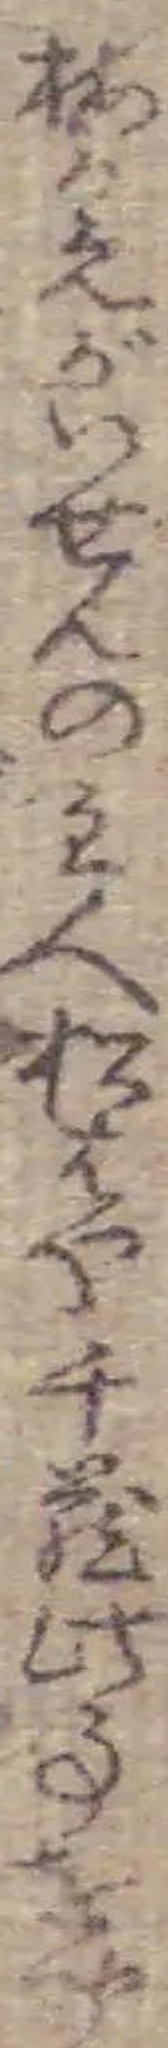梅かえがいぜんの主人松はや千蔵此事を聞
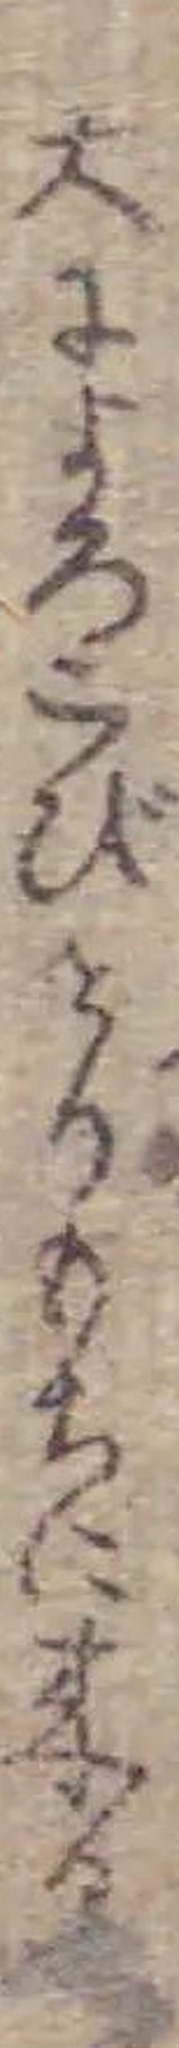大によろこびとりもちに来る
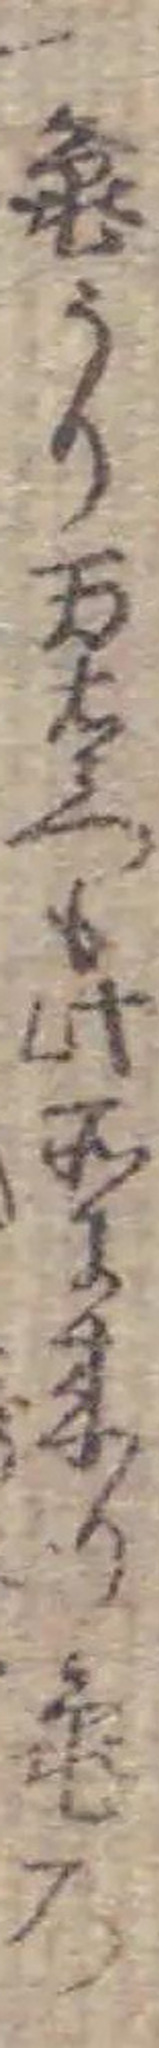亀うり万右衛門も此所に来り亀の
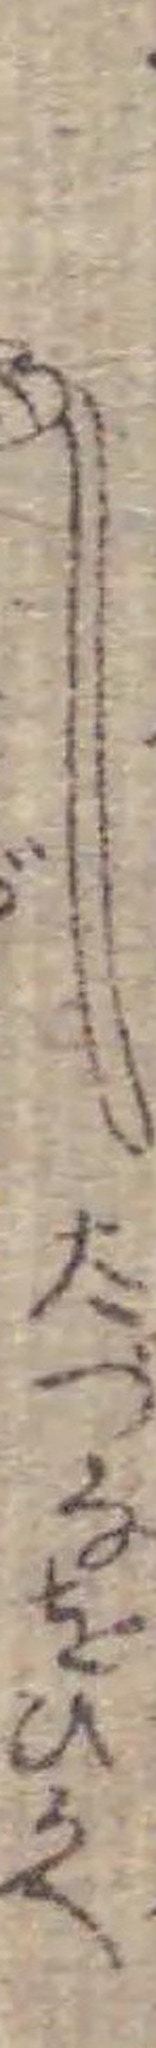太づなをひかへ
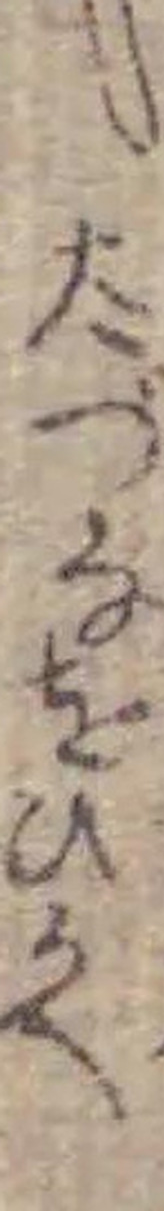太づなをひかへ
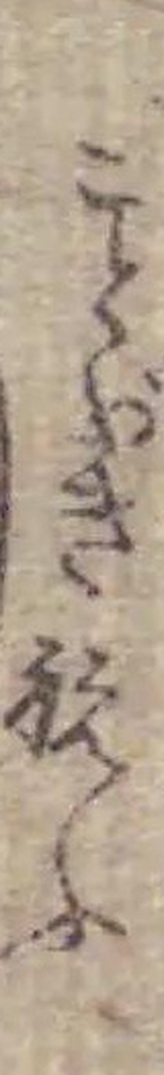ことぶき祝ふ
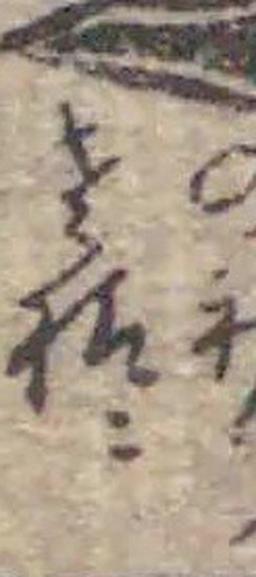左様に
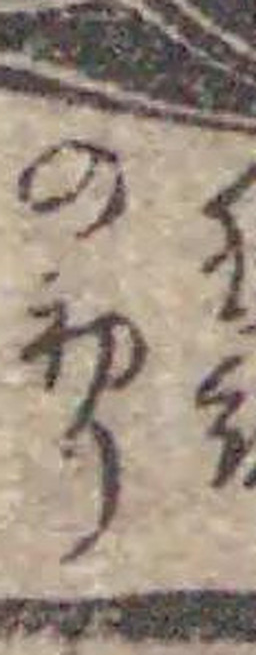の初り
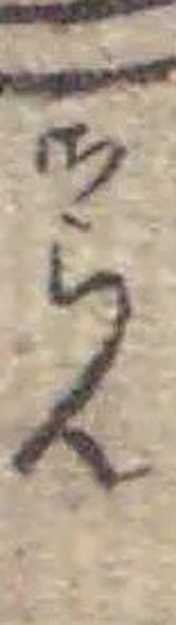御らん
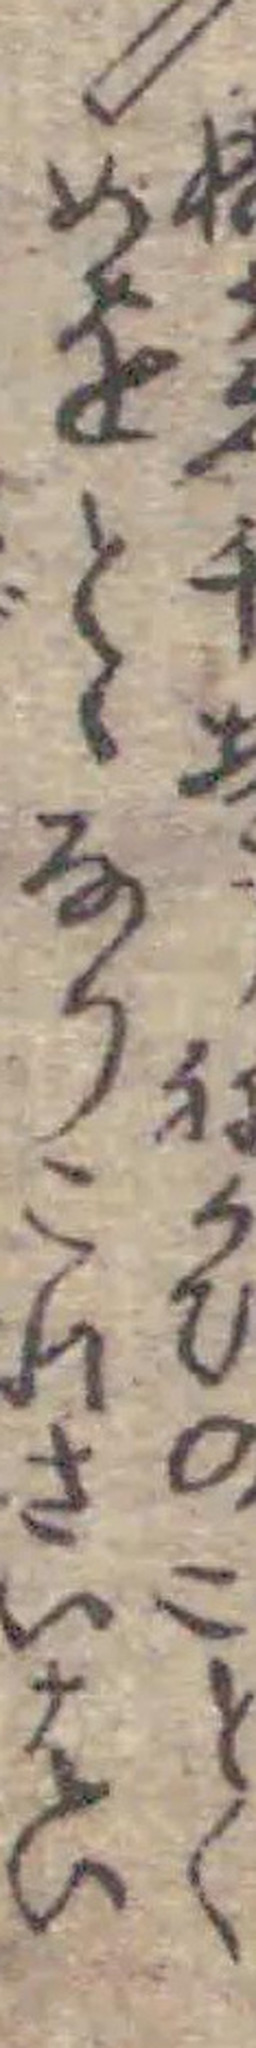めをとゝなりこれさいはい
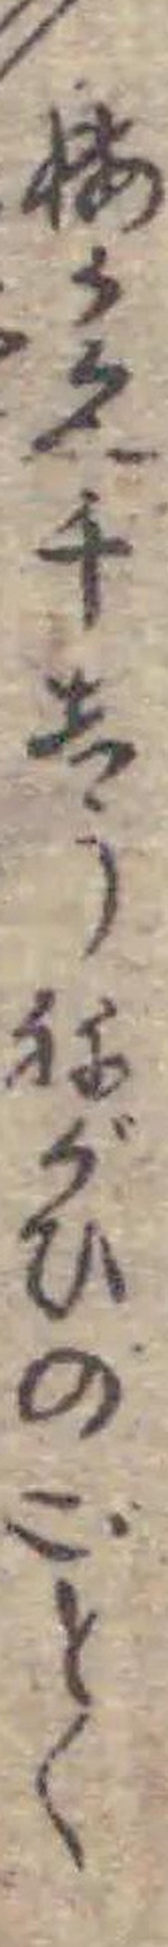梅かえ千しうねがひのごとく
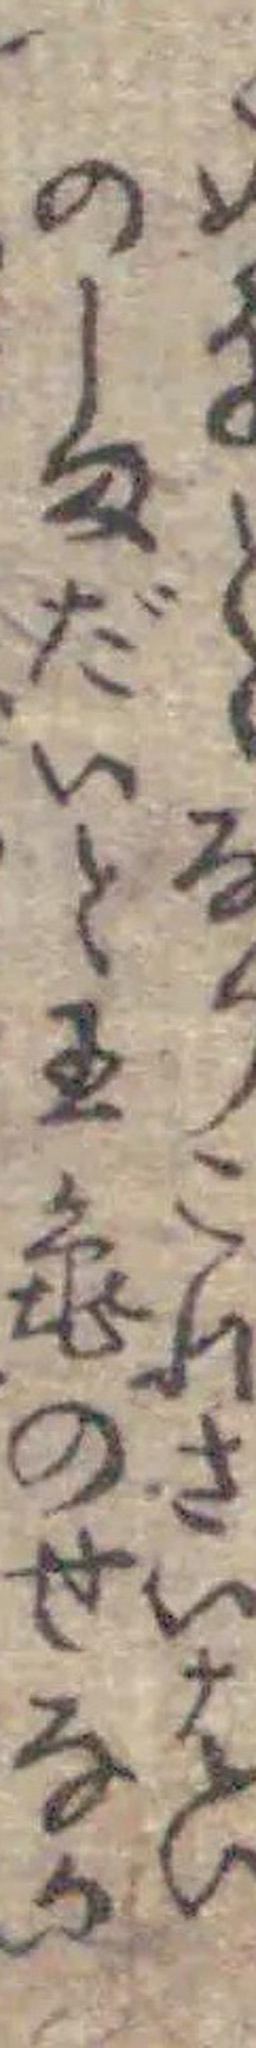のしまだいと王亀のせなか
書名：見立蓬莱 : 2巻
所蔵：国立国会図書館 National Diet Library, JAPAN
